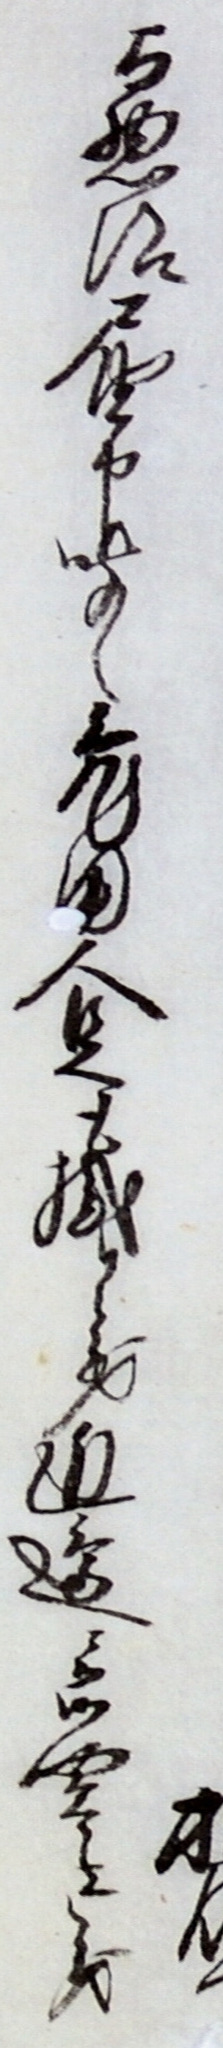与惣治届申聞候用人足も掛候義近辺ニ而御座候之義

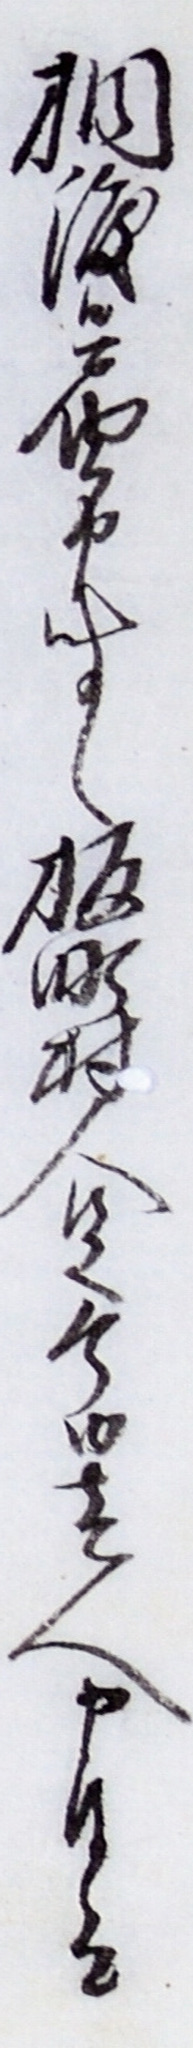相渡候届申聞候板町村人足今日壱人申付候置
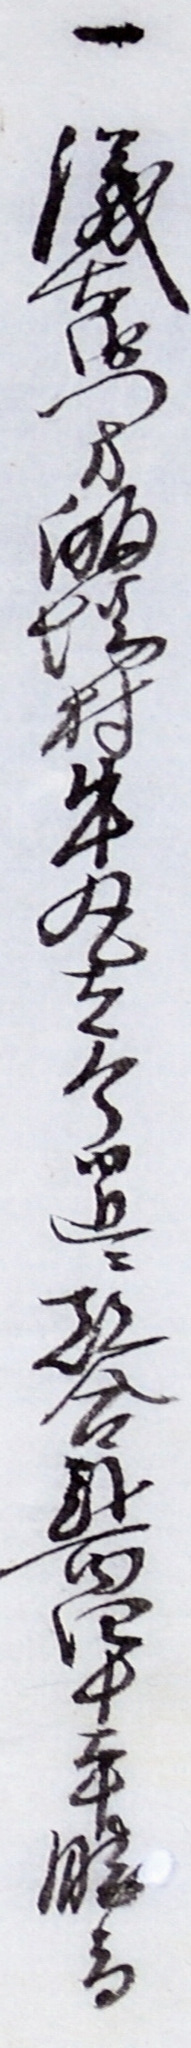一儀右衛門方的場村牛丸太今日迄ニ都合弐百四十本勝間
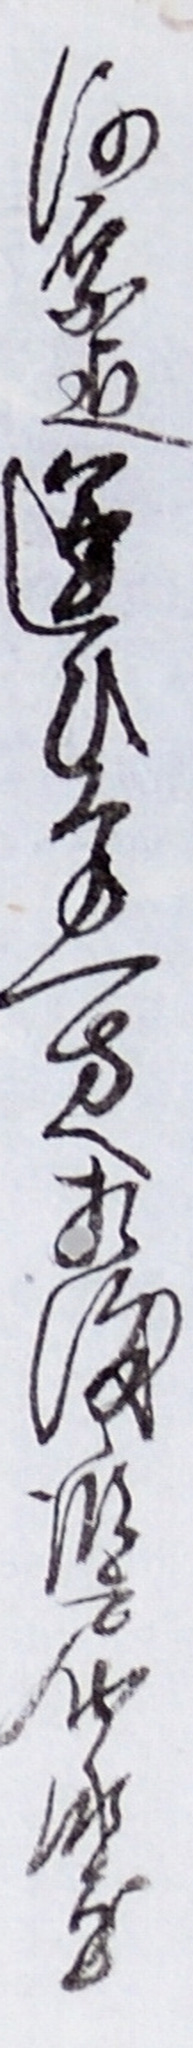河原迄運ひ方一方へ相渡候段届御座候
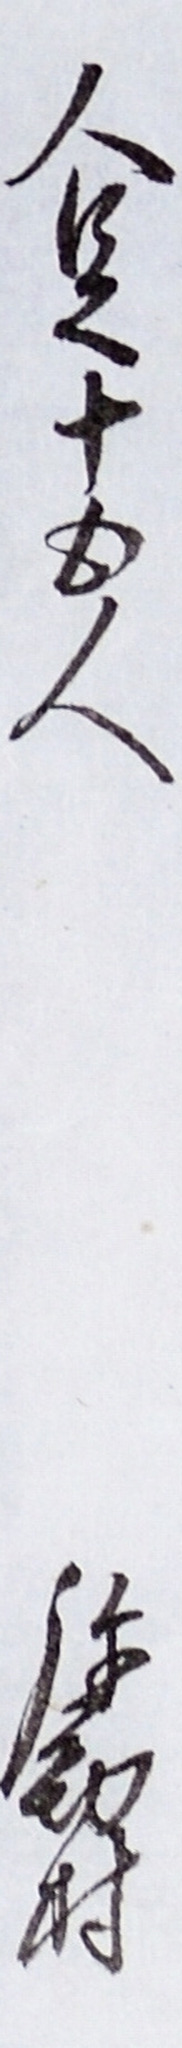人足十五人弥勒村
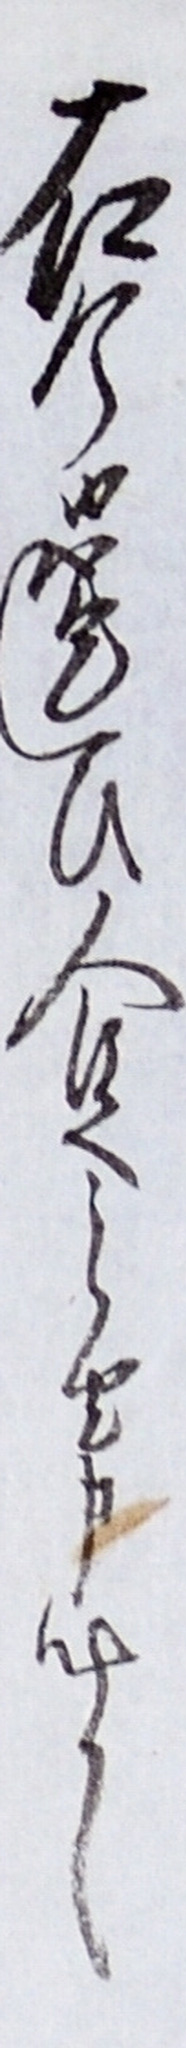右今違ひ人足之由申聞候
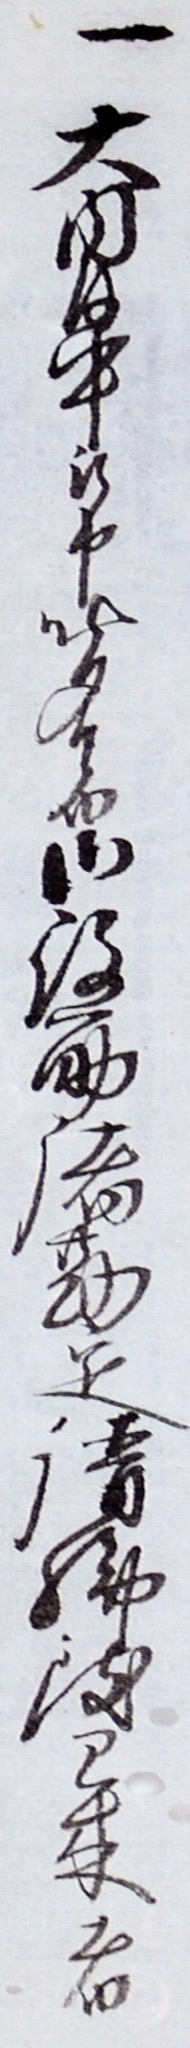一大目付中被申聞候由御役筋諸勘定請払致已来者
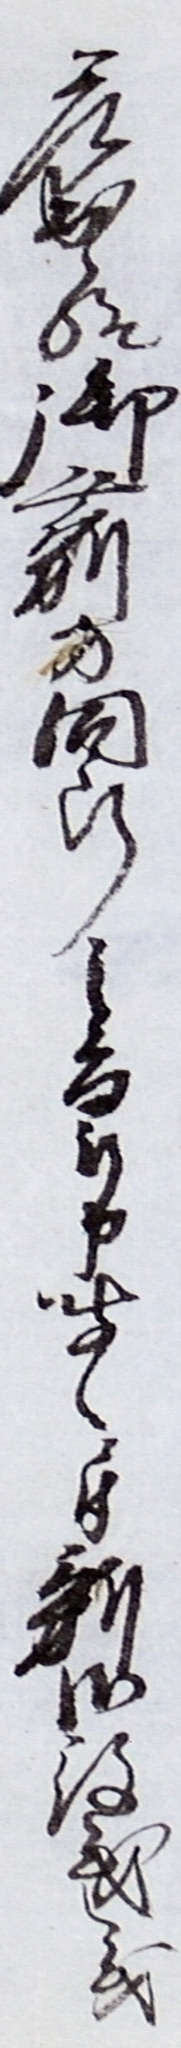差出候様御薪方同断之旨被申聞候ニ付新御役義之義
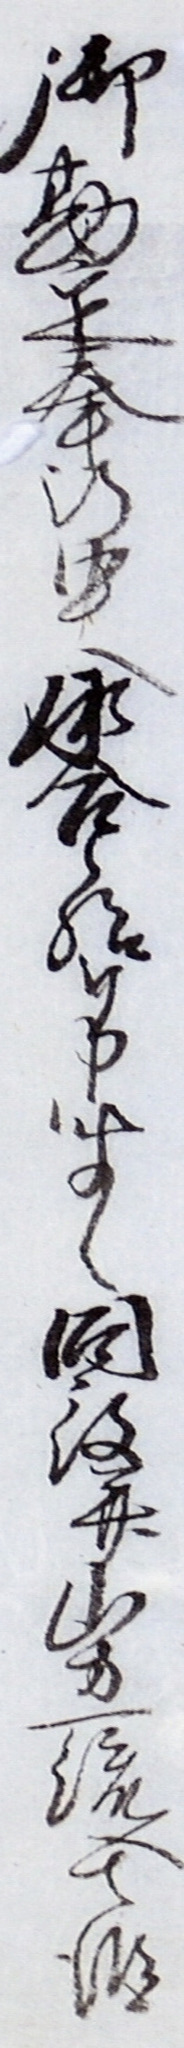御勘定奉行中へ承合候様被申聞候同役并山方一統へ其段
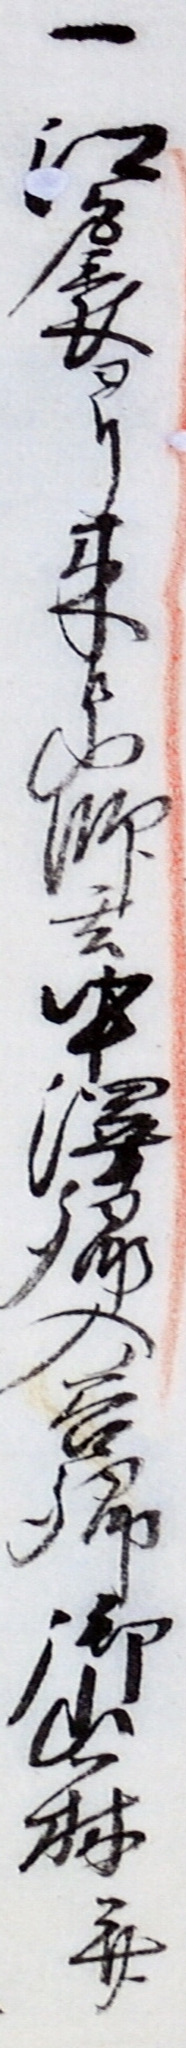一江戸表ヨリ来候山師共中沢郷入ノ谷郷御山林并
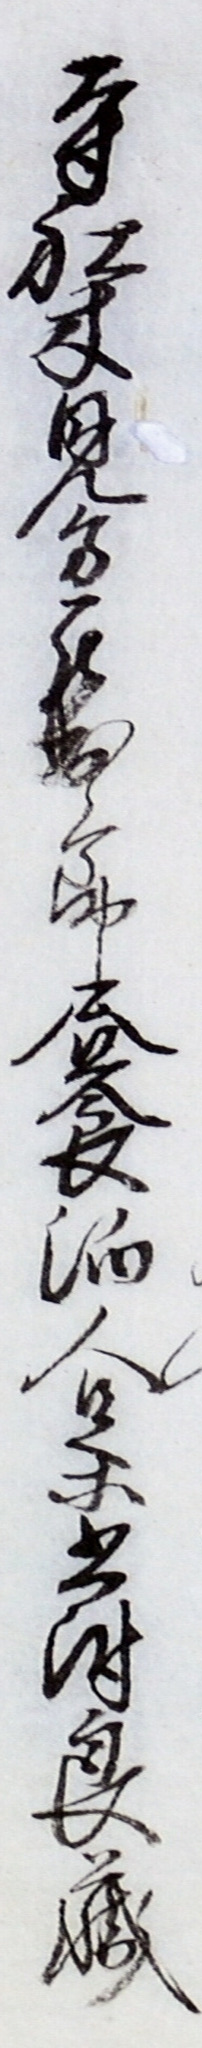一寺社木見方罷出候節昼食泊人足等書付良蔵
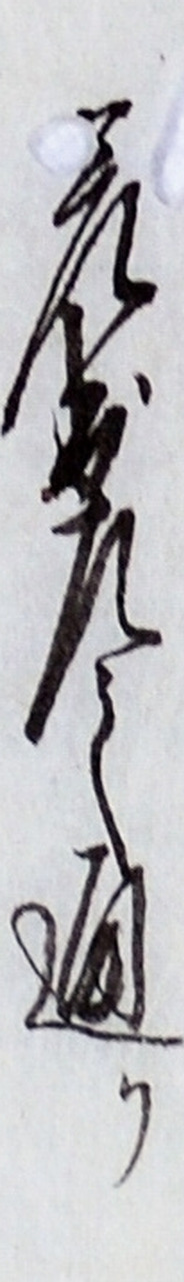差出左之通り
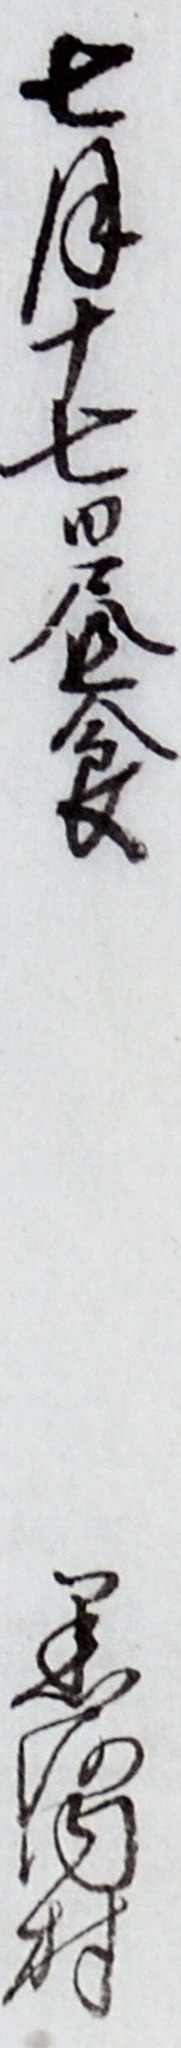七月十七日昼食黒河内村
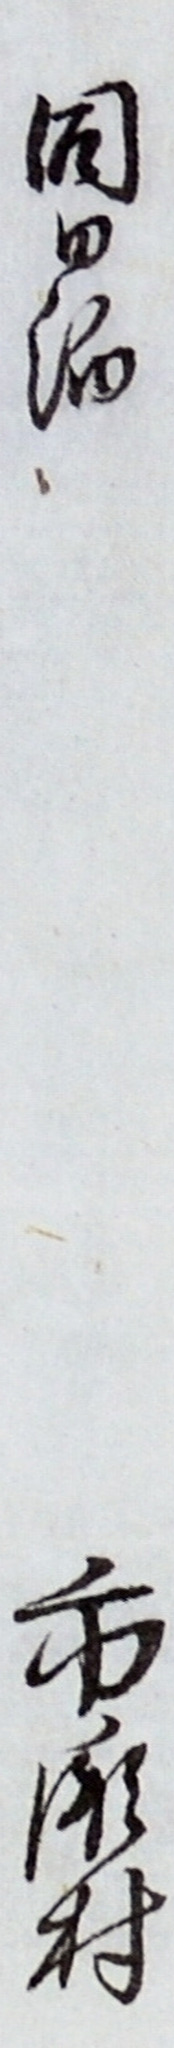同日泊市ノ瀬村
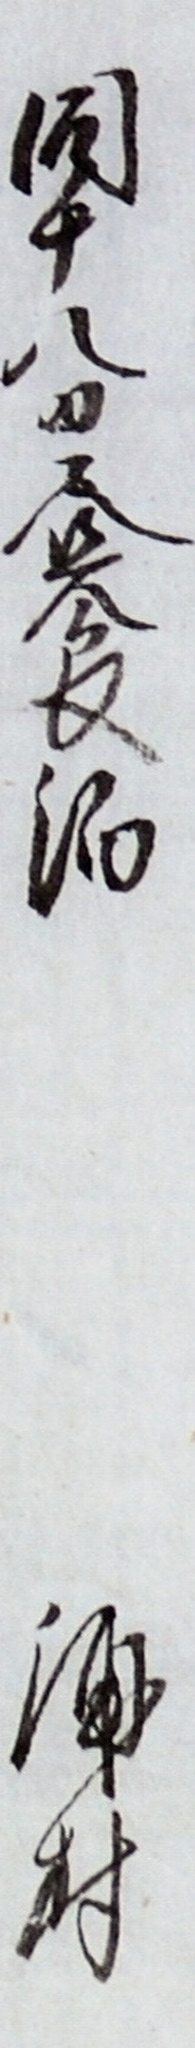同十八日昼食泊浦村
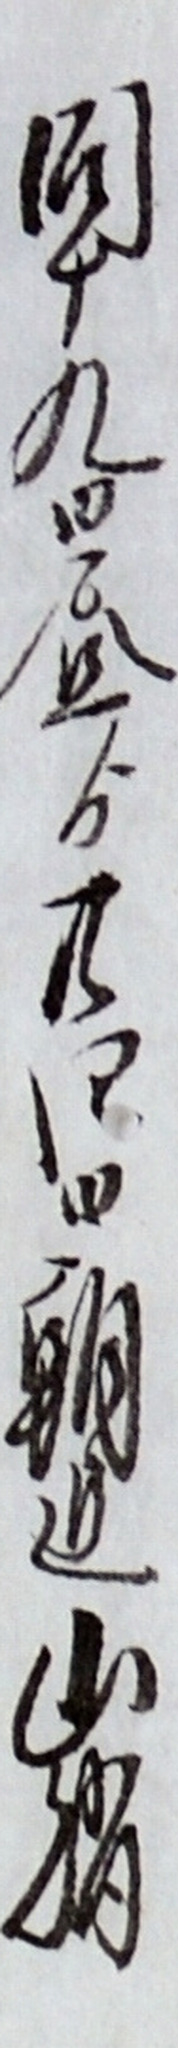同十九日昼より廿四日朝迄山崩
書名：御山奉行御用控
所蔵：伊那市立高遠町図書館・合同会社AMANE
